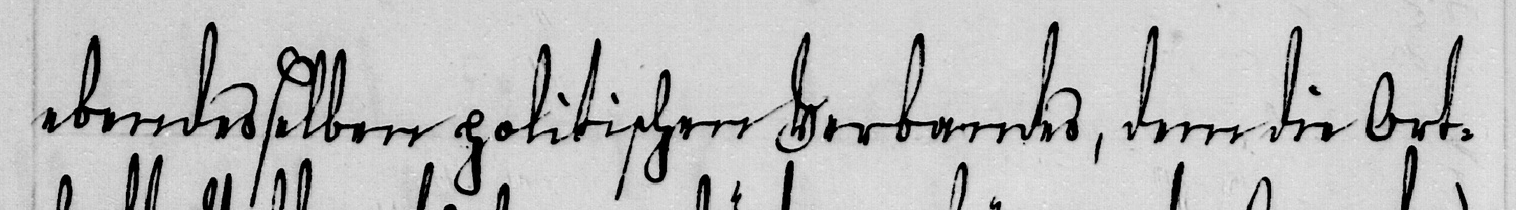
ebendesselben politischen Verbandes, dem die Ort¬
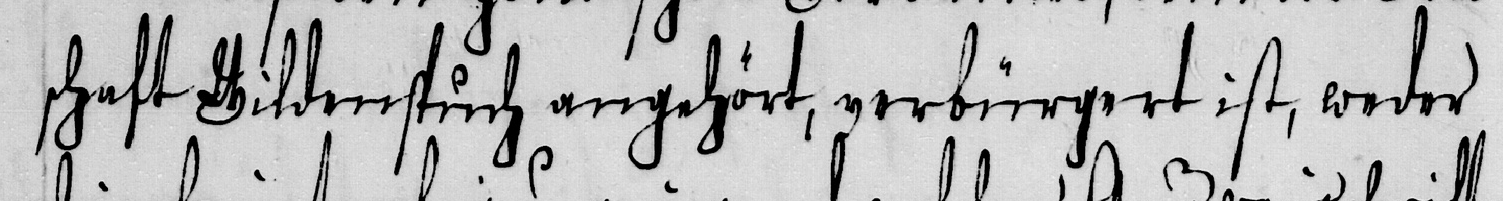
schaft Wildenspuch angehört, verbürgert ist, weder
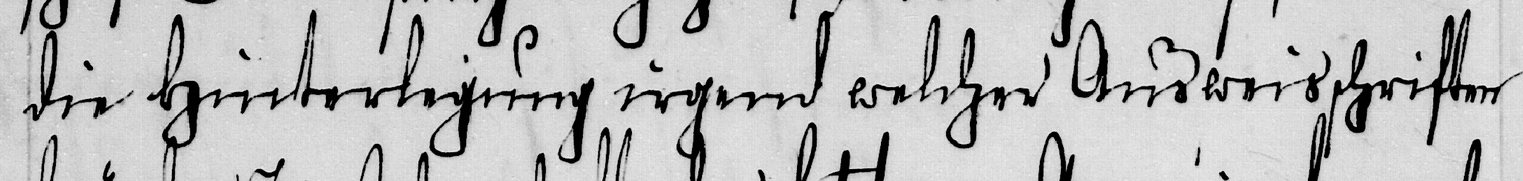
die Hinterlegung irgend welcher Ausweisschriften
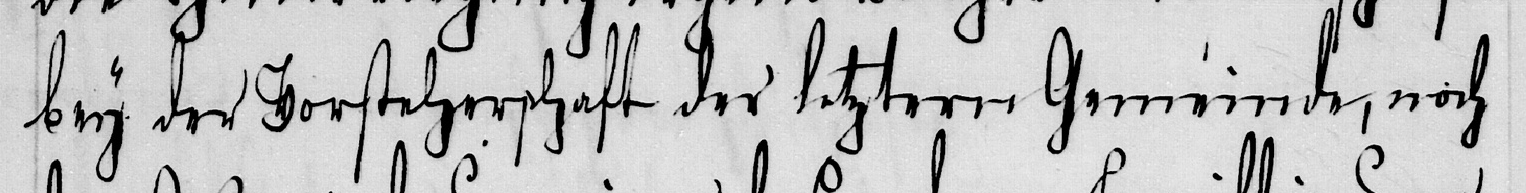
bey der Vorsteherschaft der letztern Gemeinde, noch
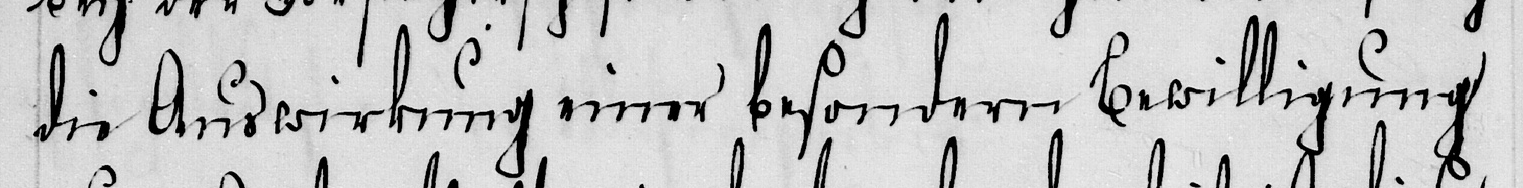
die Auswirkung einer besondern Bewilligung
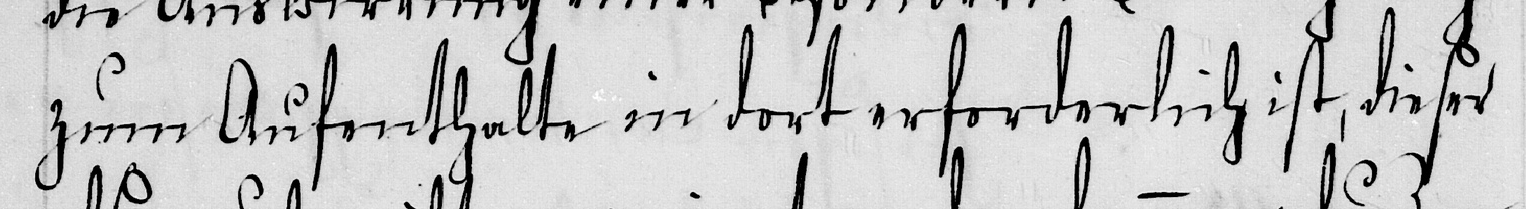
zum Aufenthalte in dort erforderlich ist, dieser
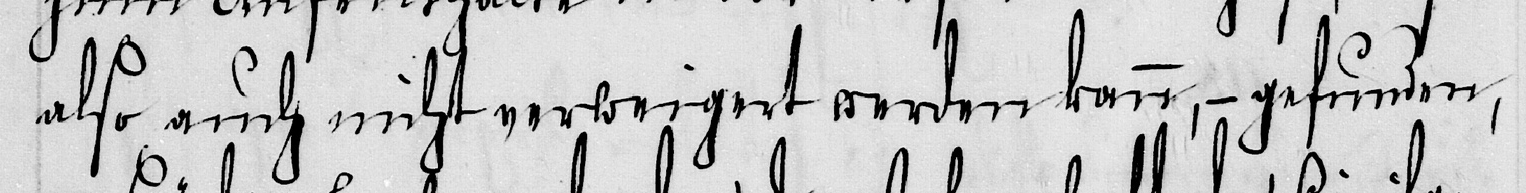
also auch nicht verweigert werden kann, – gefunden,
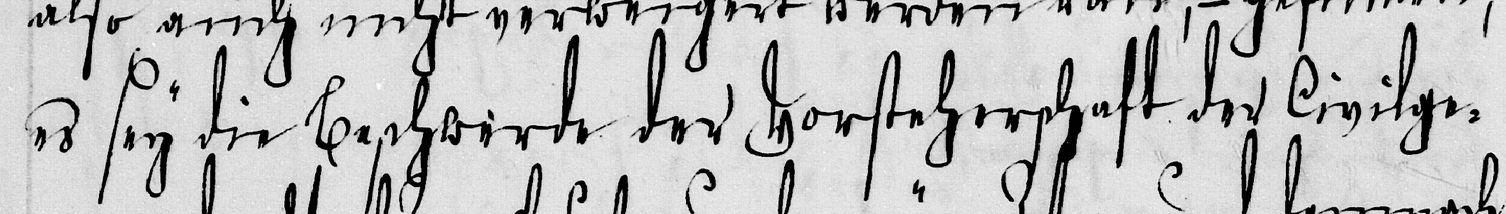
es sey die Beschwerde der Vorsteherschaft der Civilge¬
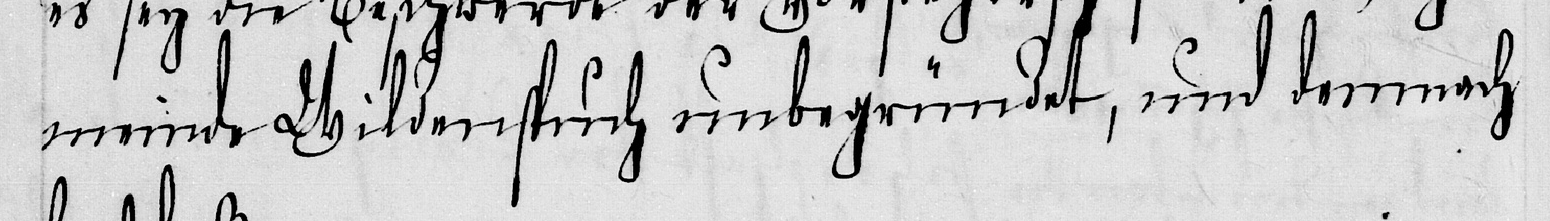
meinde Wildenspuch unbegründet, und demnach
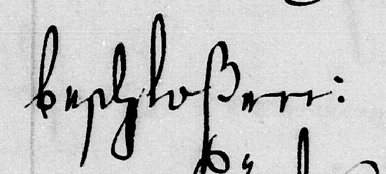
beschloßen:
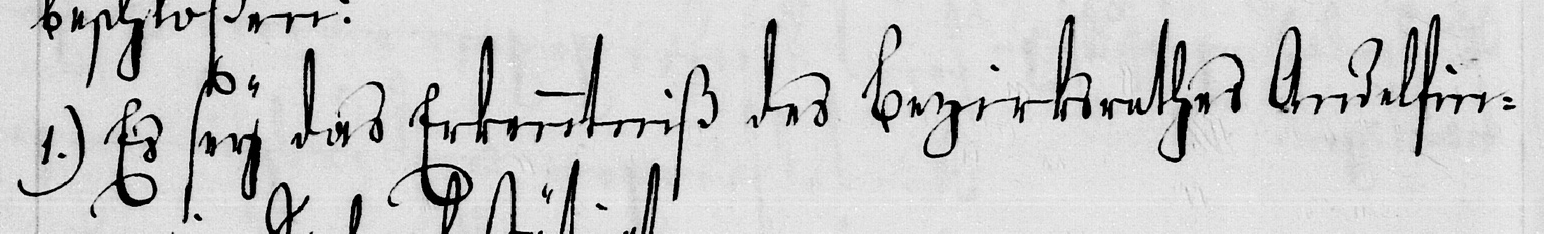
1.) Es sey das Erkenntniß des Bezirksrathes Andelfin¬
